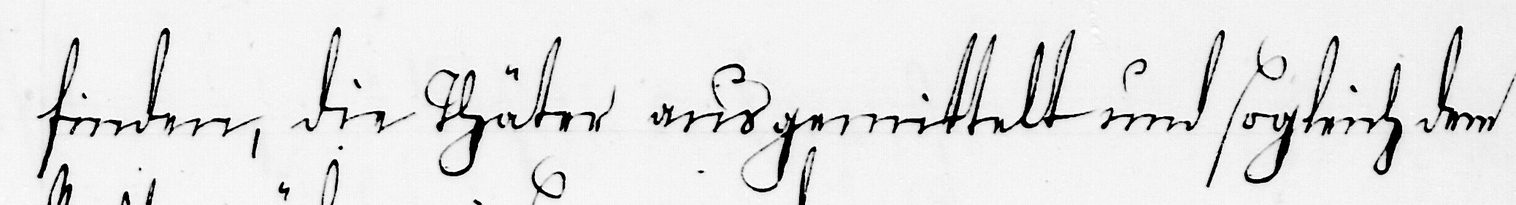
finden, die Thäter ausgemittelt und sogleich dem
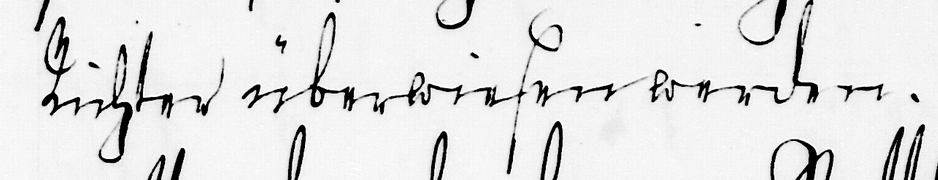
Richter überwiesen werden.
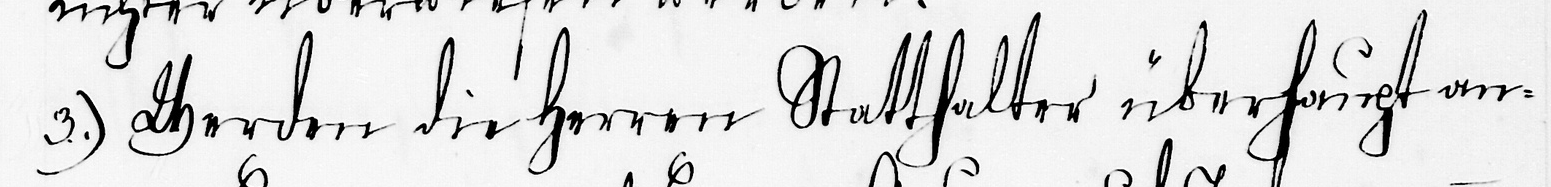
3.) Werden die Herren Statthalter überhaupt an¬
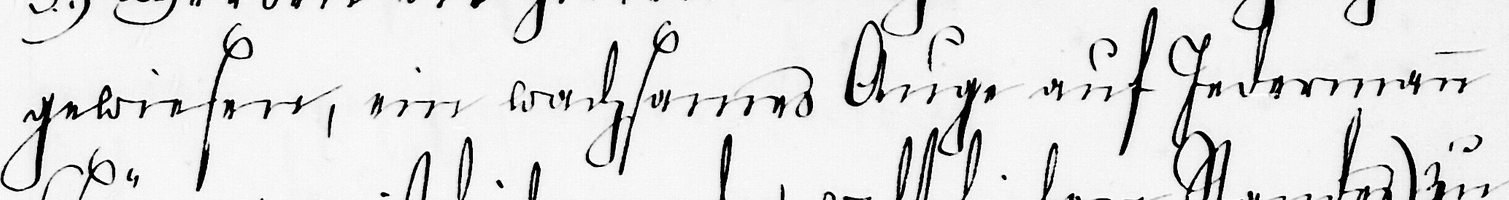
gewiesen, ein wachsames Auge auf Jedermann
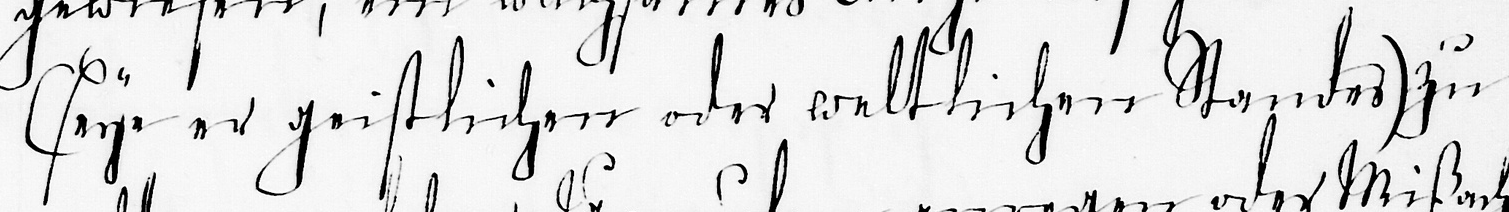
(seye er geistlichen oder weltlichen Standes) zu
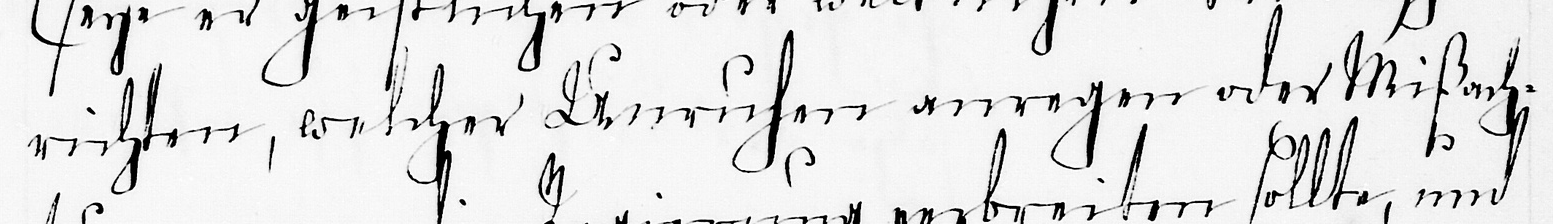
richten, welcher Unruhen anregen oder Mißach¬
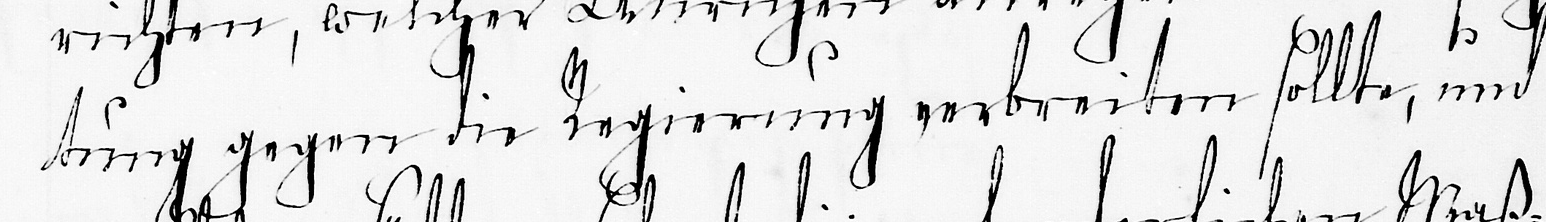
tung gegen die Regierung verbreiten sollte, und
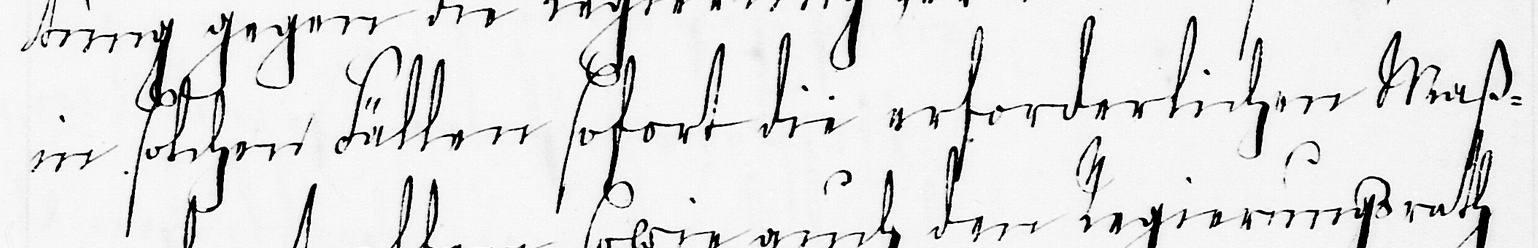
in solchen Fällen sofort die erforderlichen Maß¬
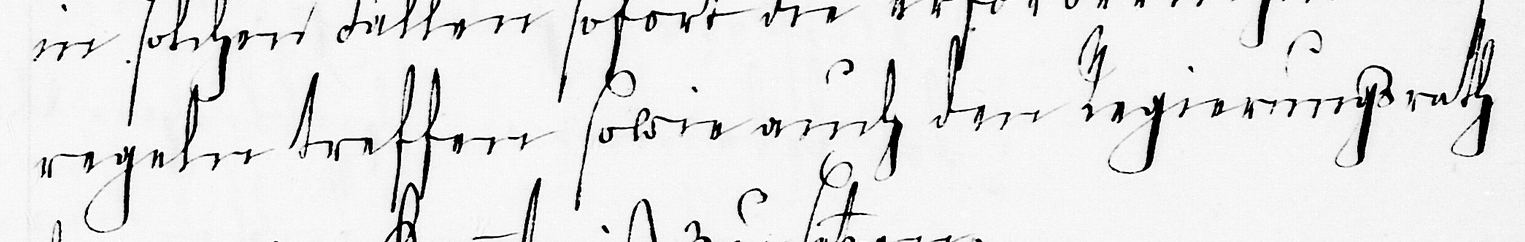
regeln treffen sowie auch den Regierungsrath
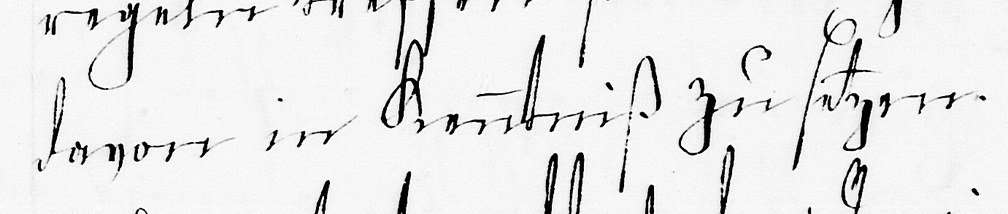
davon in Kenntniß zu setzen.
